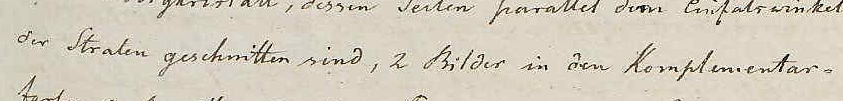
der Stralen geschnitten sind, 2 Bilder in den Komplementar-
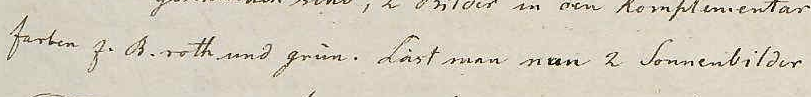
farben z. B. roth und grün. Läst man manun 2 Sonnenbilder
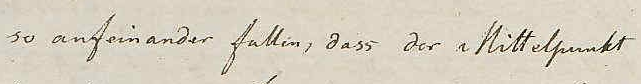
so aufeinander fallen, dass der Mittelpunkt
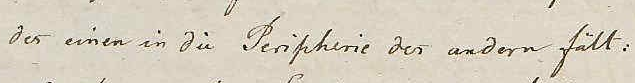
des einen in die Peripherie des andern fält:
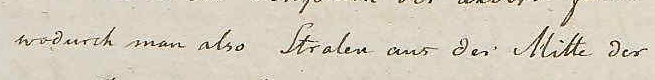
wodurch man also Stralen aus der Mitte der
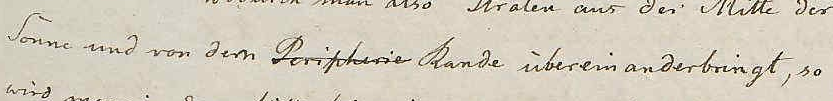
Sonne und von derm Peripherie Rande übereinanderbringt, so
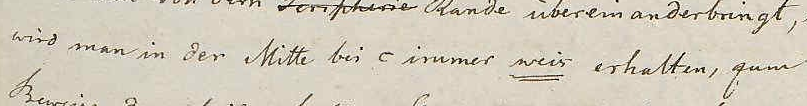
wird man in der Mitte bei c immer weis erhalten, zum
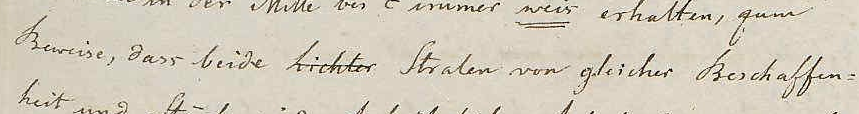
Beweise, dass beide LichterStralen von gleicher Beschaffen-
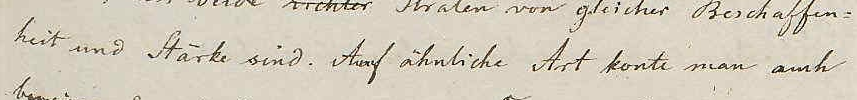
heit und Stärke sind. Auf ähnliche Art konte man auch
